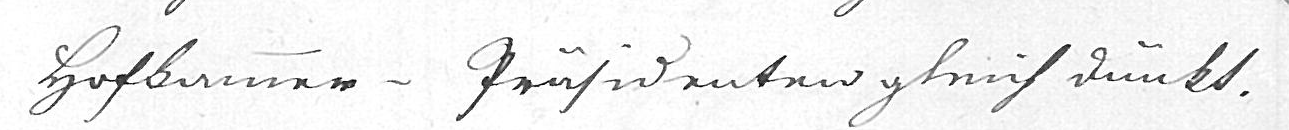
Hofkammer-Präsidenten gleich dünkt.
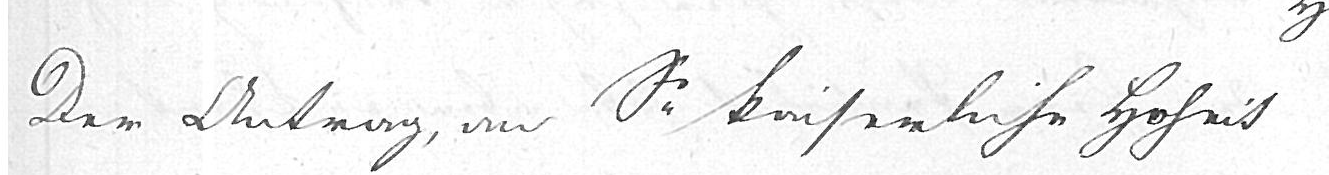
Der Antrag an Sr. kaiserliche Hoheit
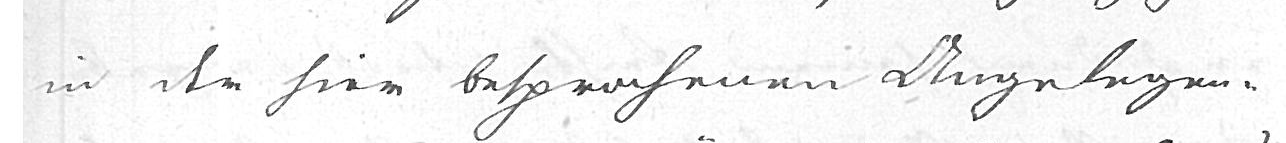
in der hier besprochenen Angelegen-
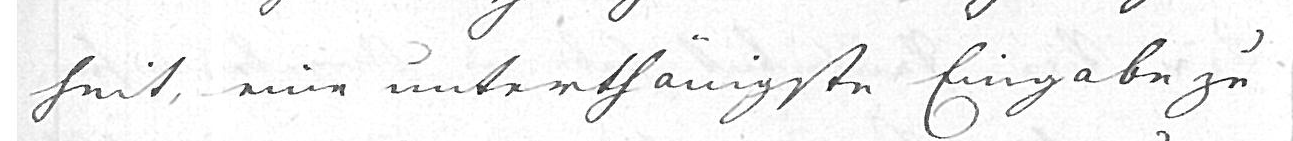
heit eine unterthänigste Eingabe zu
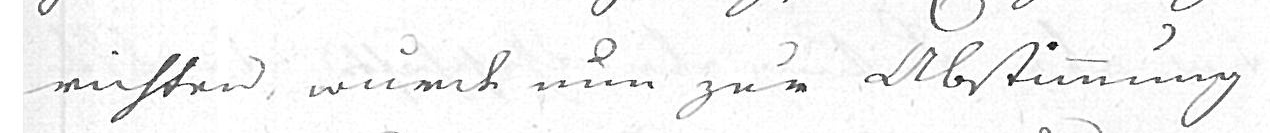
richten, wurde nun zur Abstimmung
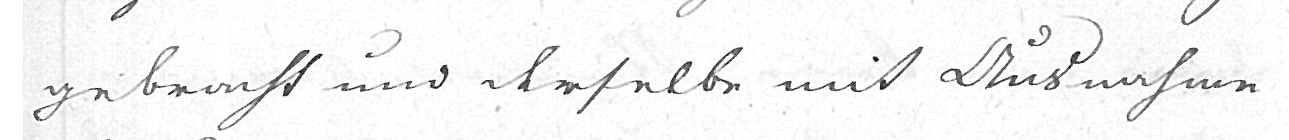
gebracht und derselbe mit Ausnahme
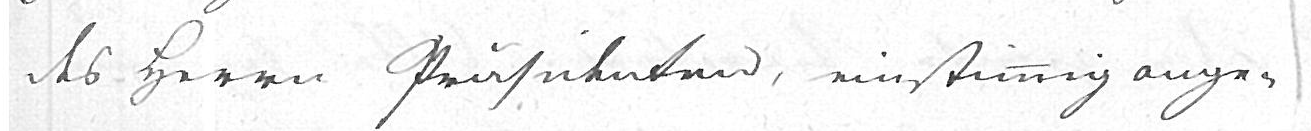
des Herrn Präsidenten, einstimmig ange-
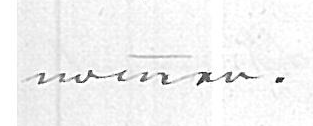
nommen.
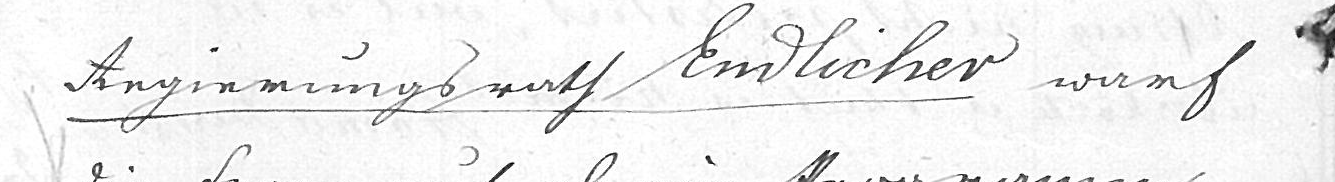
Regierungsrath Endlicher warf
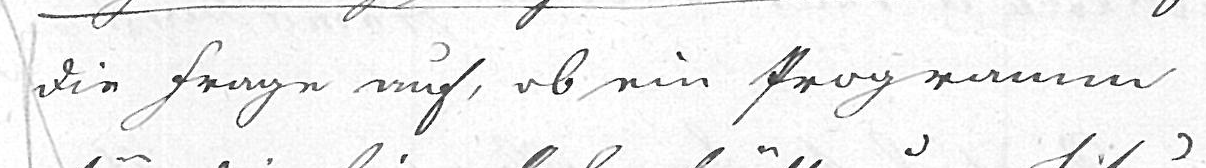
die Frage auf, ob ein Programm
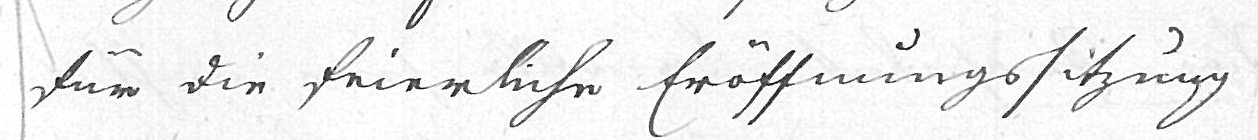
für die feierliche Eröffnungssitzung
